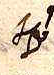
tpo
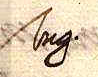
lug.
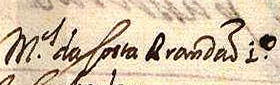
M.el da Costa Brandaõ i.o
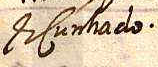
E Cunhado.
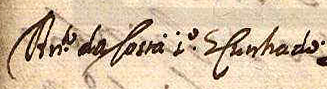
An.to da Costa i.o E Cunhado
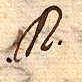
R.
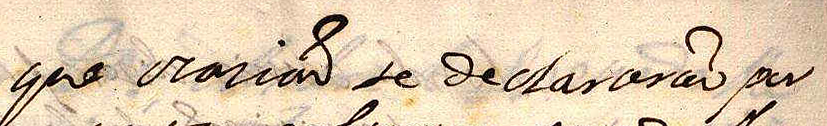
que ocaziaõ se declararão por
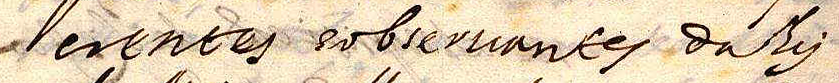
crentes E obseruantes da llej
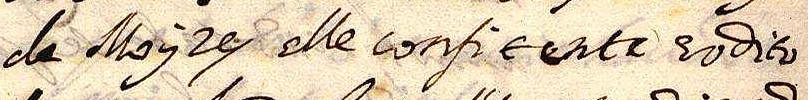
de Moyzes Elle confitente E o dito
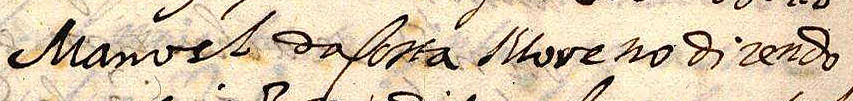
Manoel da Costa Moreno dizendo
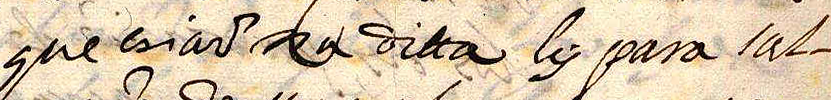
que criaõ na ditta lej para sal
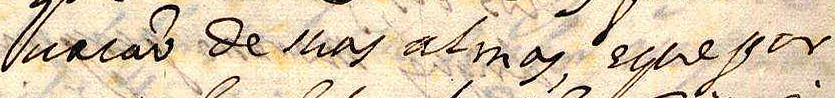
uaçaõ de suas almas, e que por
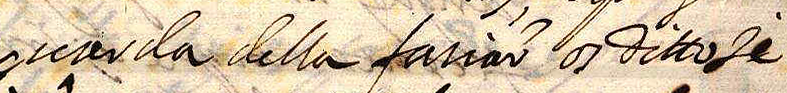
guarda della faziaõ os dittos je
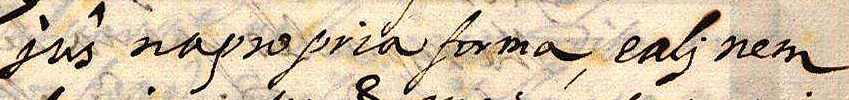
jūs na propria forma, e alj nem
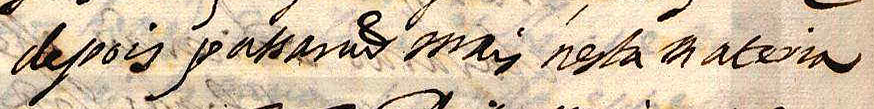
depois passaraõ mais nesta materia
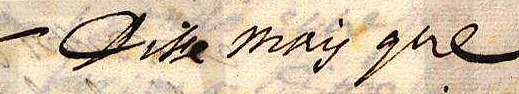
Disse mais que
